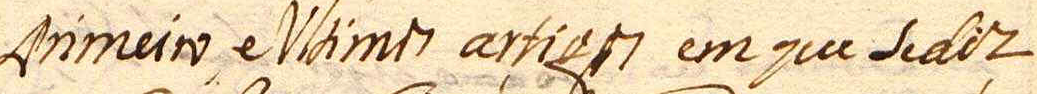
Primeiro, e Vltimos artigos em que se diZ,
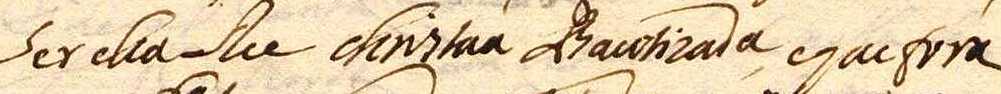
Ser ella Ree christaã Bautizada, e que fora
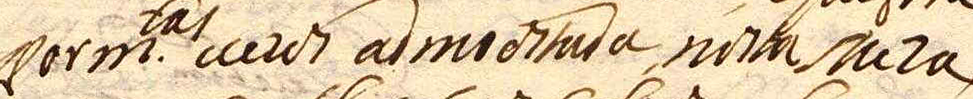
por m.tas uezes admoestada, nesta meza
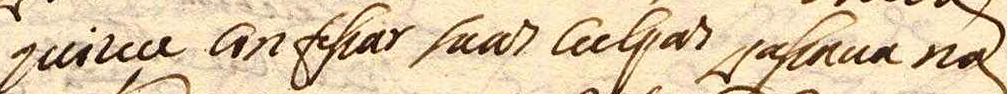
quizece confessar suas culpas passaua na
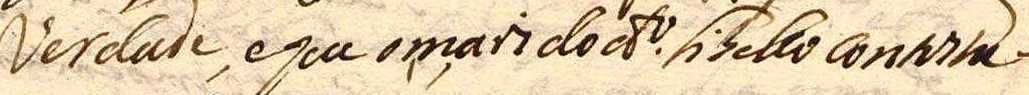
Verdade, e que o mais do d̄o. libello contesta
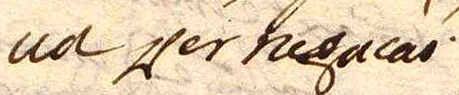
ua por negaçaõ.
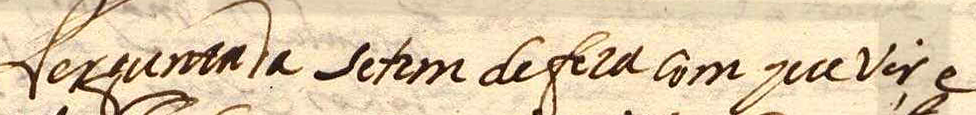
Perguntada se tem defeza com que vir, e
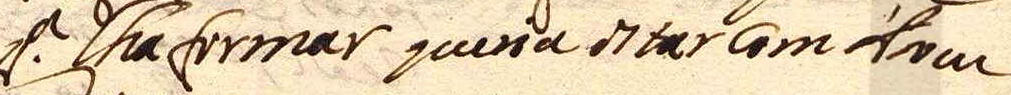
p.a lha formar queria estar com Procu
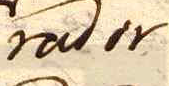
rador
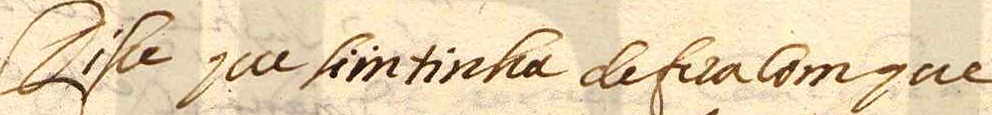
Disse que sim tinha defeza com que
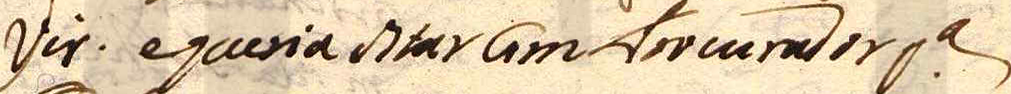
Vir; e queria estar com Procurador p.a
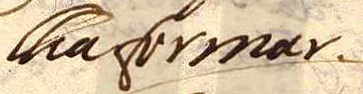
lha formar.
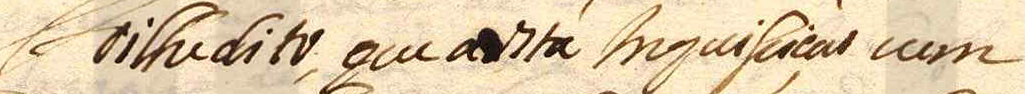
Foi lhe dito, que a esta Inquissiçaõ uem
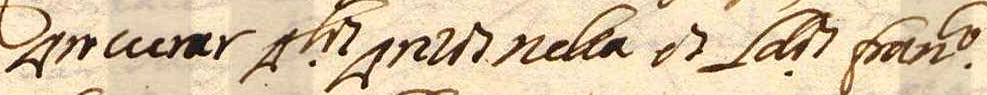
procurar p.los prezos nella os Ld.os fran.co
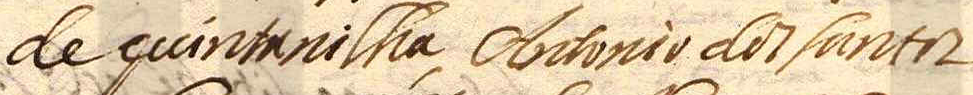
de quintanilha, Antonio dos santoz
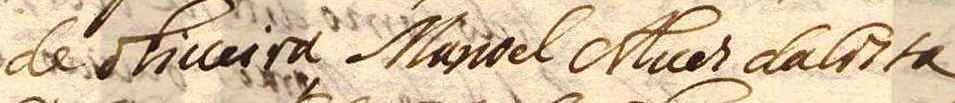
de oliueira, Manoel Alues da Costa
